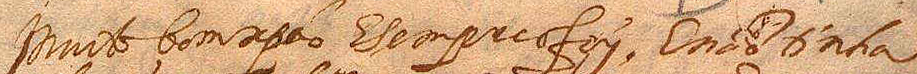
muito bom xpaõ E sempre foy, E não tinha
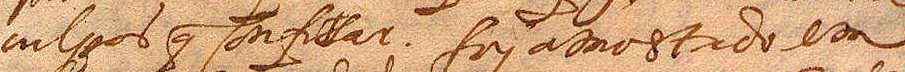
culpas q̄ confessar foy amoestado em
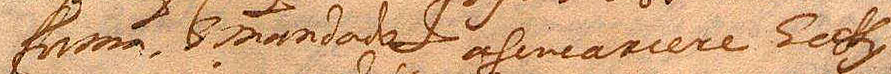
forma, E mandado a seu carcere E assy
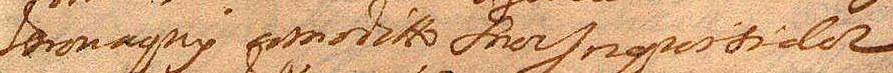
nou aquy com o ditto snor Jnquisidor
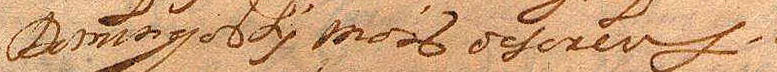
Domingos Symões o escreuj.
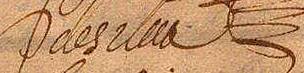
Po de silua
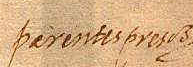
perentes presos
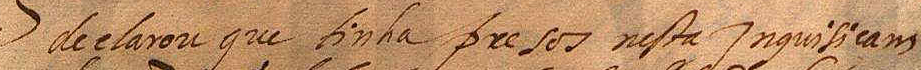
E declarou que tinha presos nesta Jnquisiçam
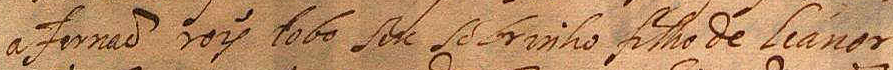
a Fernaõ rois̄ lobo seu sobrinho filho de leanor
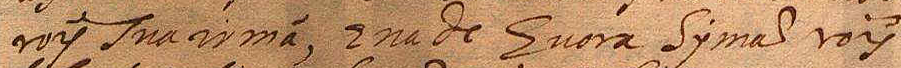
rois̄ sua irmā, E na de Euora Symaõ rois̄
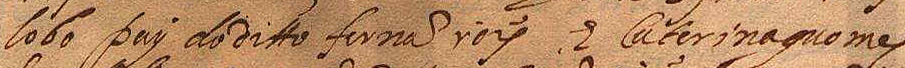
lobo pay do ditto fernaõ roiz, E Caterina guomes
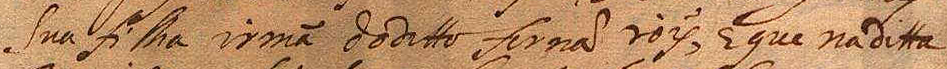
sua filha irmā do ditto fernaõ rois̄, E que na ditta
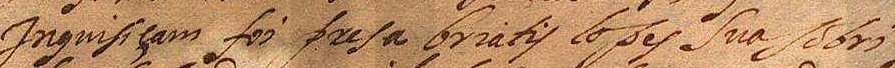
Jnquisiçam foi presa briatis lopes sua sobri
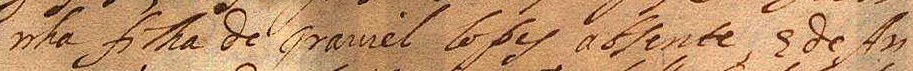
nha filha de grauiel lopes absente, E de An
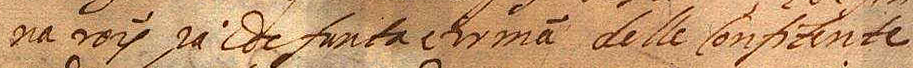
na rois̄ ia defunta e irmā delle Confitente
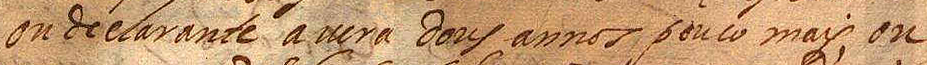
ou declarante auera dous annos pouco mais, ou
